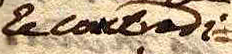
he contradi
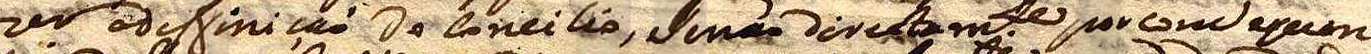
zer a deffiniçaõ do concilio, senão directam.te por consequen
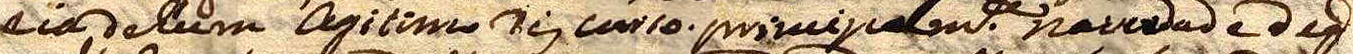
cia de hum Legitimo discurso. principalm.te. na verdade de q̄
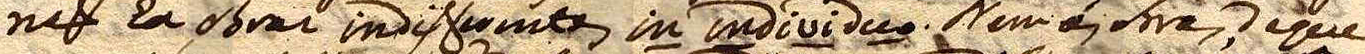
naꝭ ha obraz indifferentes in individuo. Nem as obras, de que
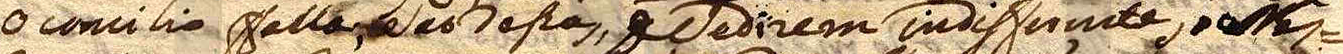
o concilio ffalla, saõ dessas, q̄ se dizem indifferente, e Nes
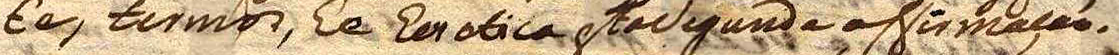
tes termos, he heretica esta segunda affirmaçaõ.
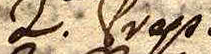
2.a Prop.
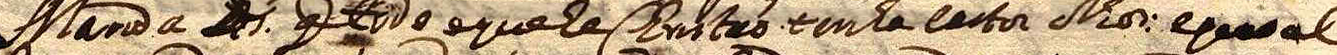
Manda Ds̄. q̄ tudo e que he Christaõ tenha castoz olhos: e qual
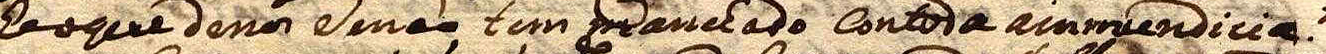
he o que de nos senão tem manchado con toda a inmundicia?
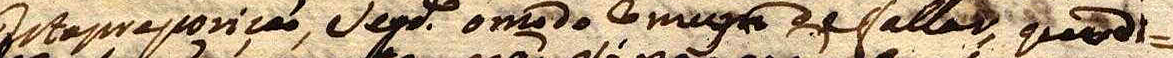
Esta prepoziçaõ, segd.o o modo e meyo de fallar, que di
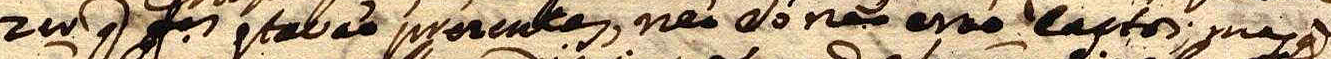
zer q̄ t.os estavaõ prezentes, não só não erão castos; mas q̄
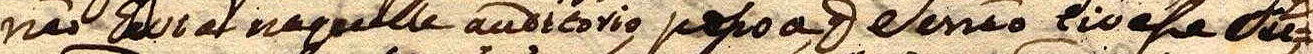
não havia naquelle auditorio pessoa q̄ se não tivesse ca
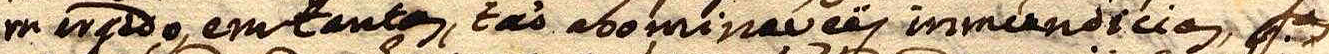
rrergado, em tantos, taõ abonimaveis inmundicias, q.tas
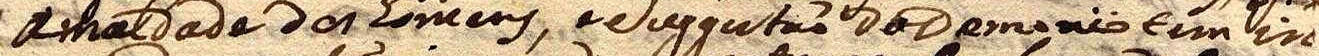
a maldade dos homens, a suggestaõ do Demonio tem in
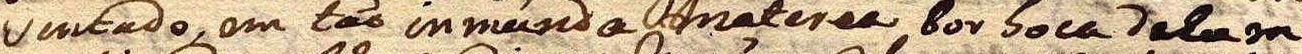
ventado, em tão inmunda materea Por boca de hum
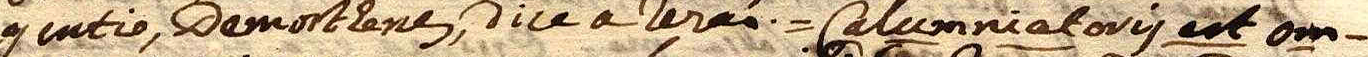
gentio, Demosthenes, dice a Rezaõ. = Calumniatoris est om
